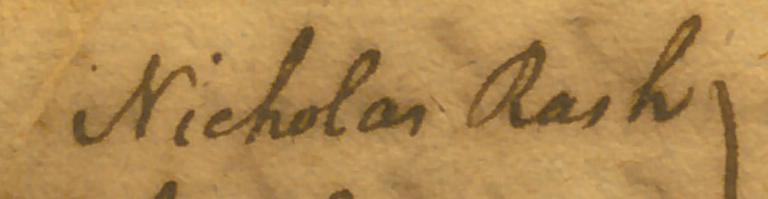Nicholas Rash
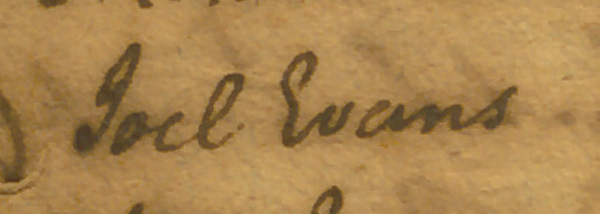Joel Evans
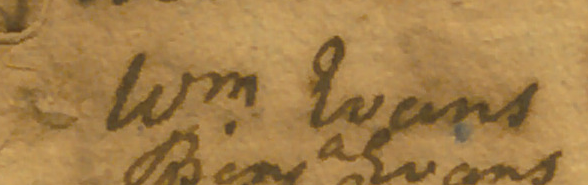W^m. Evans
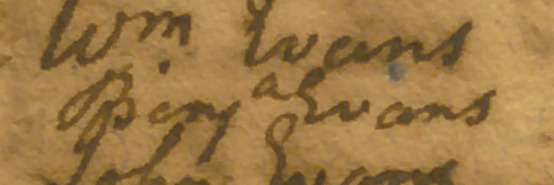Benj^a Evans
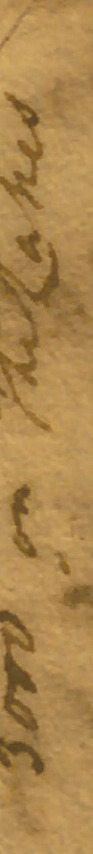3000 on the Lakes
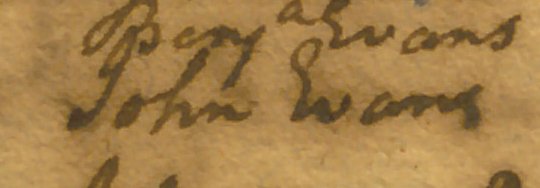John Evans
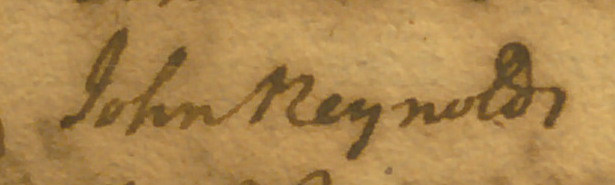John Reynolds
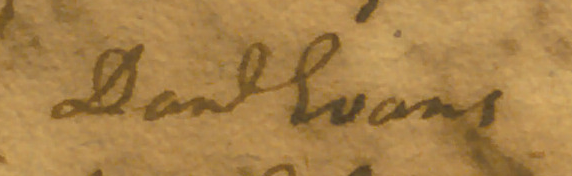Danl Evans
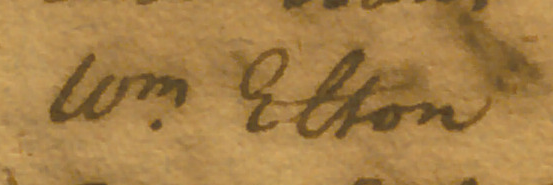W^m. Elton
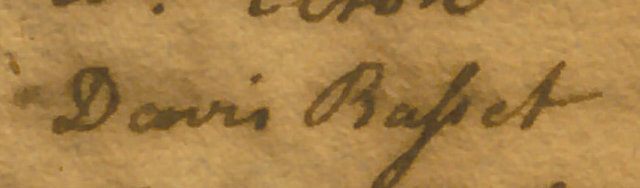Davis Basset
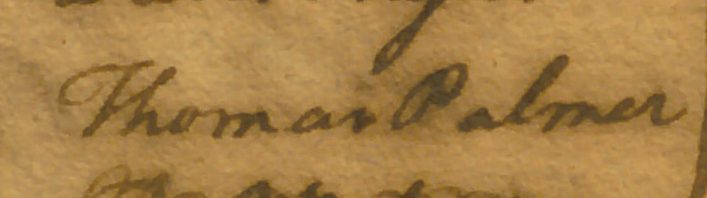Thomas Palmer
